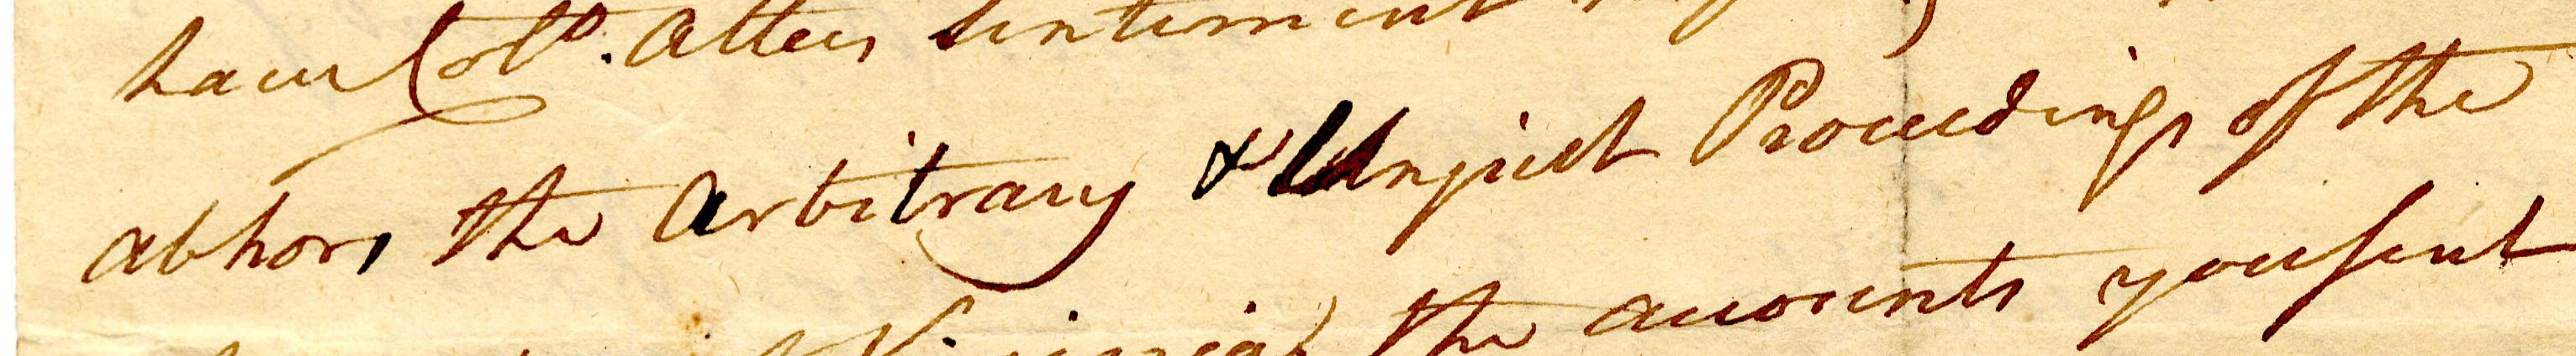abhors the Arbitrary & unjust Proceedings of the
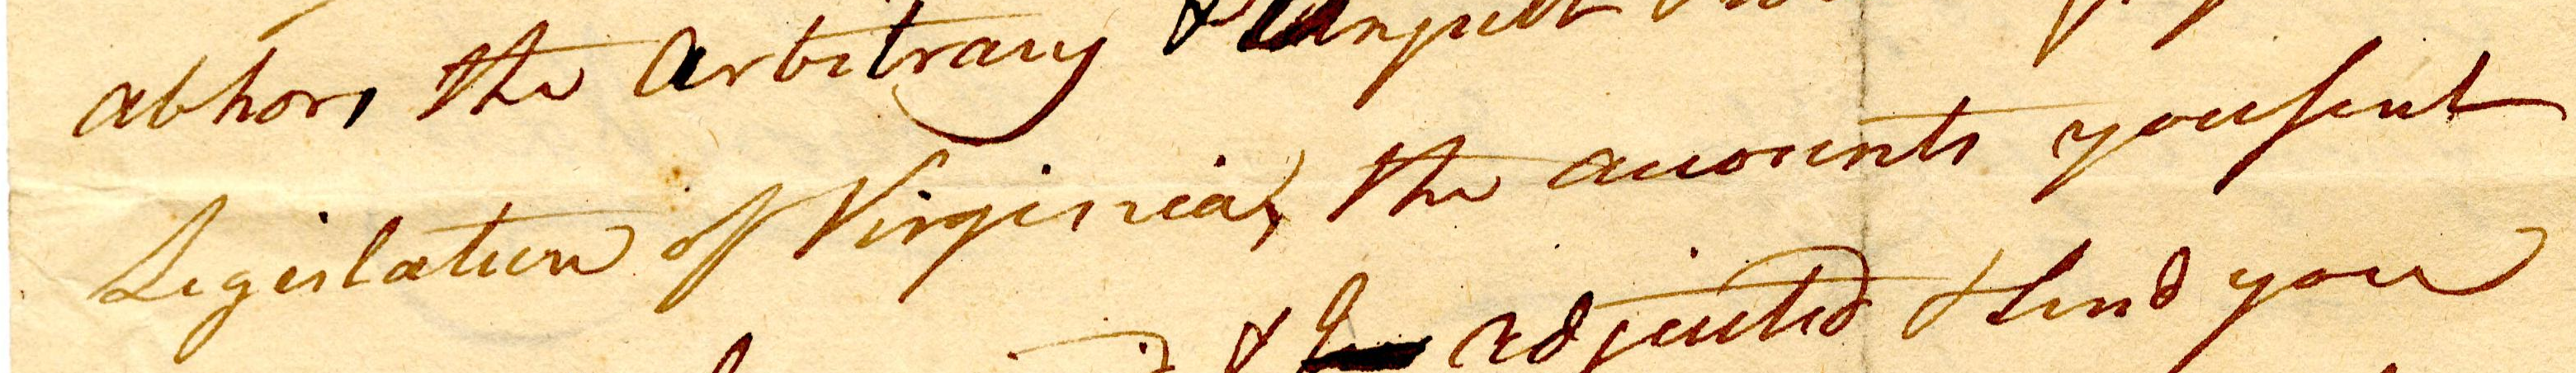Legislation of Virginia the accounts you sent
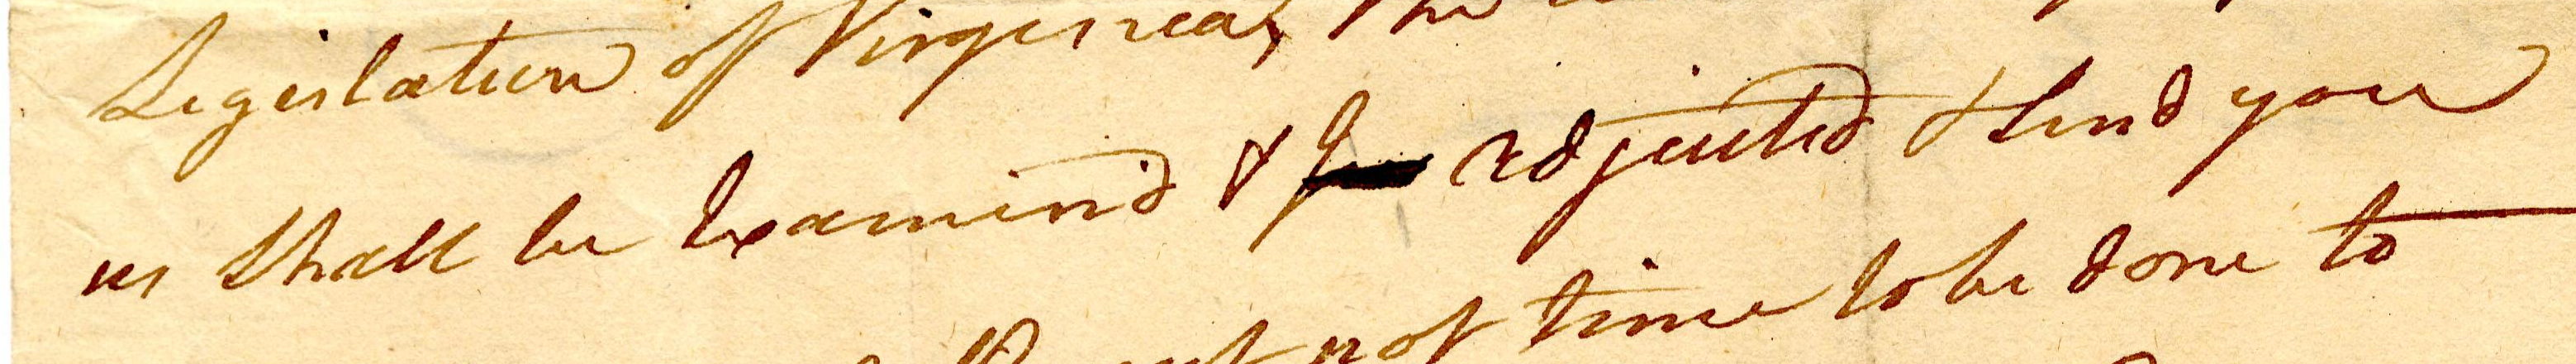us shall be Examind & [__] adjusted & send you
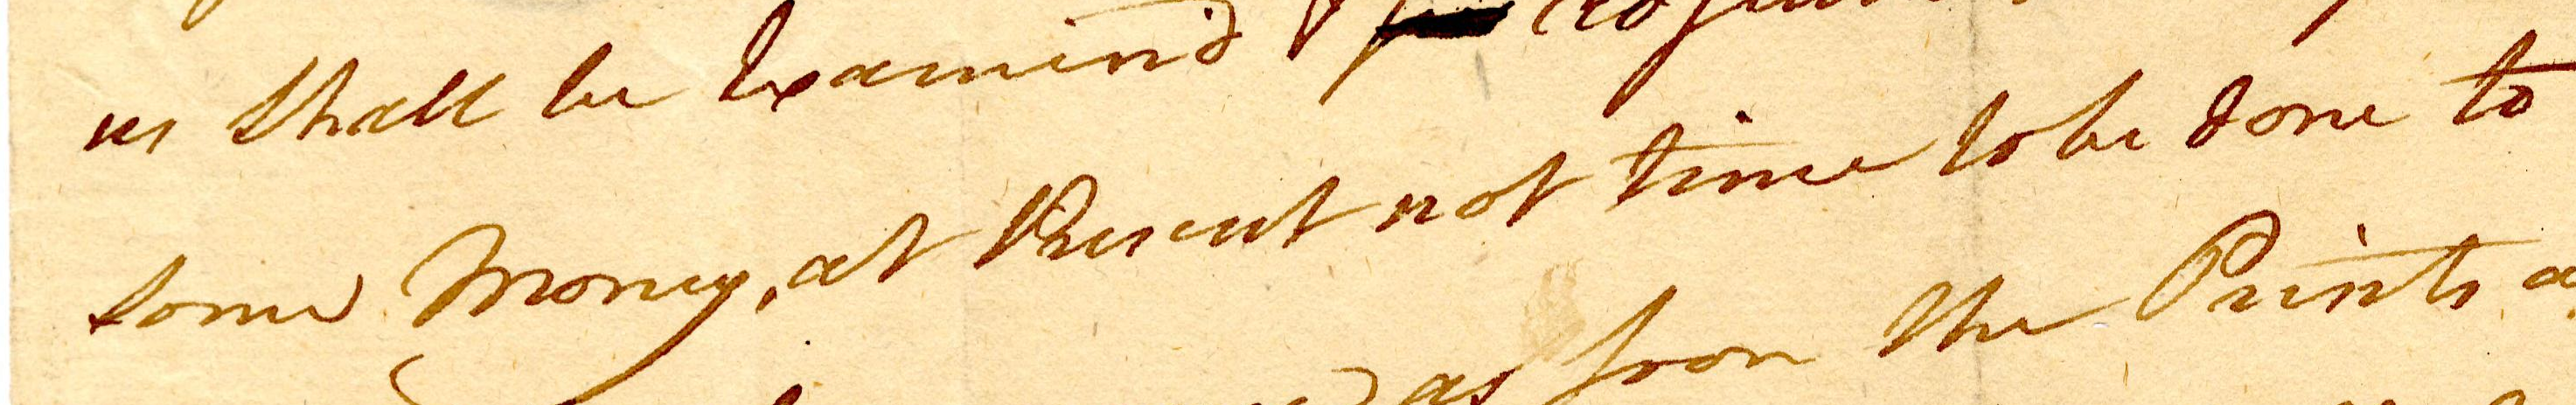some Money, at present not time to be done to
